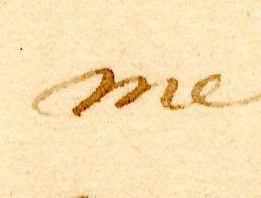me
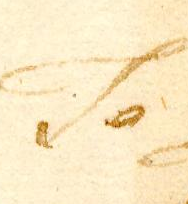To
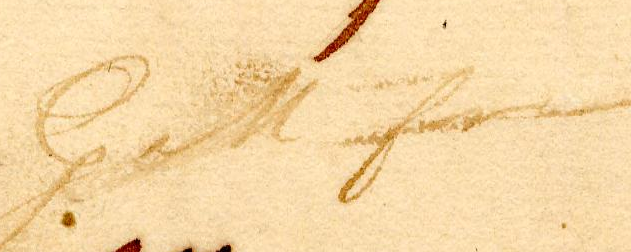G. M. for
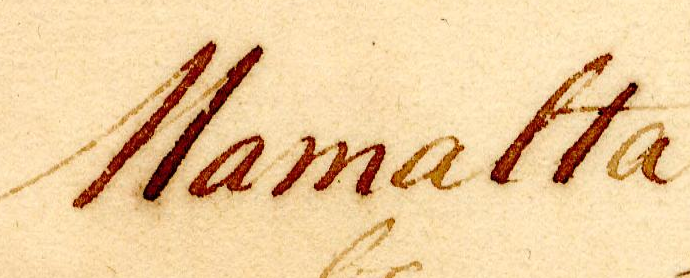Mamalta
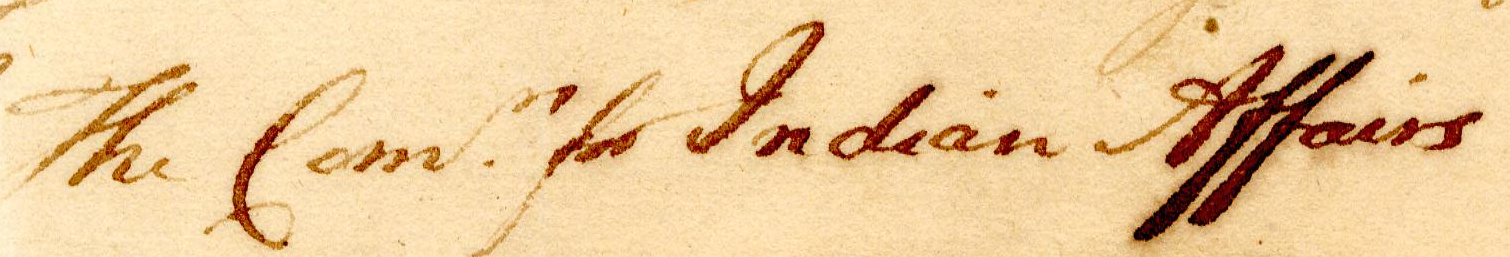The Com^n. for Indian Affairs
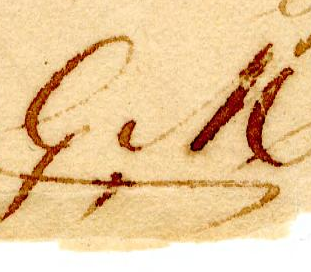G.M.
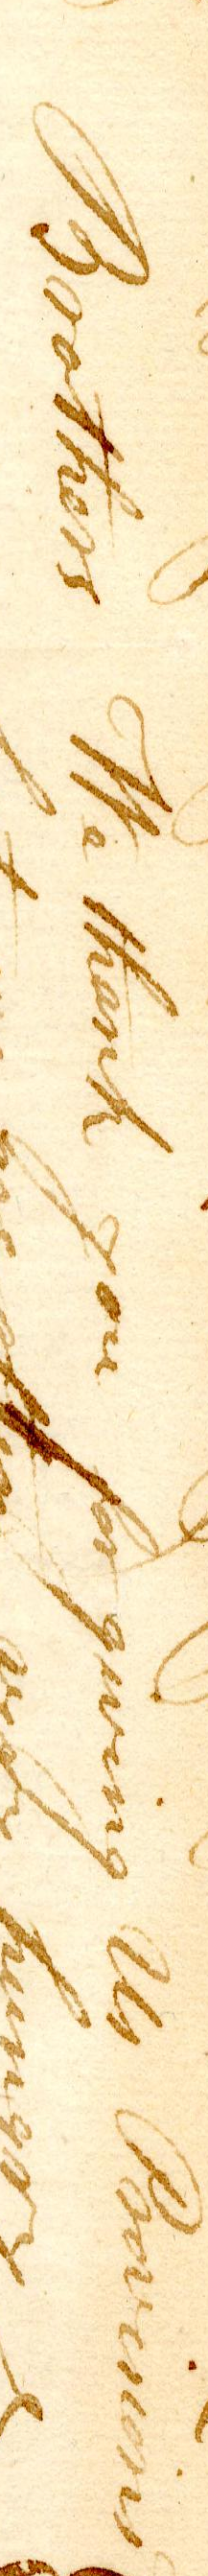Brothers We thank you for giving Us Provisions
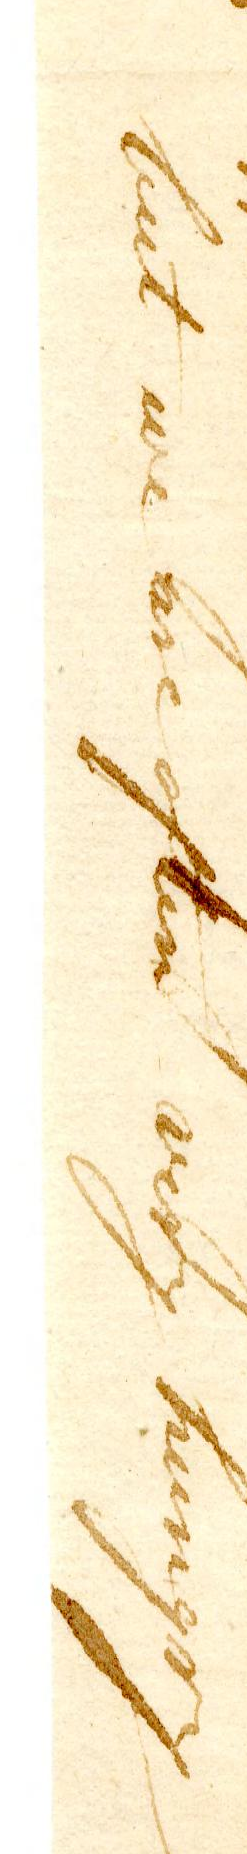but we are often very hungry
